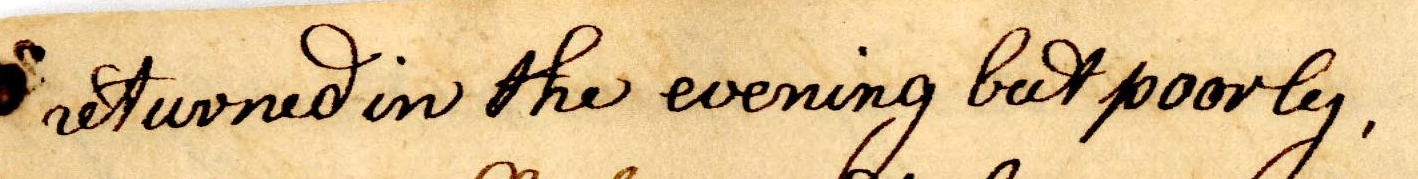returned in the evening but poorly,
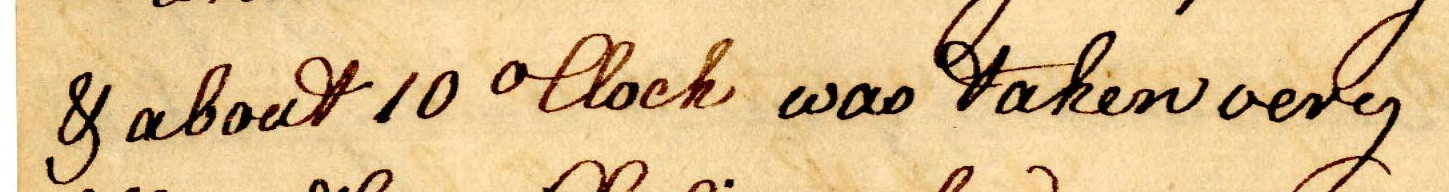& about 10 ^o Clock was taken very
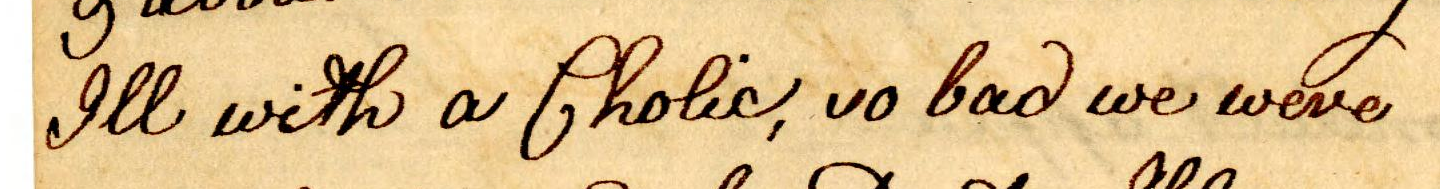Ill with a Cholic, so bad we were
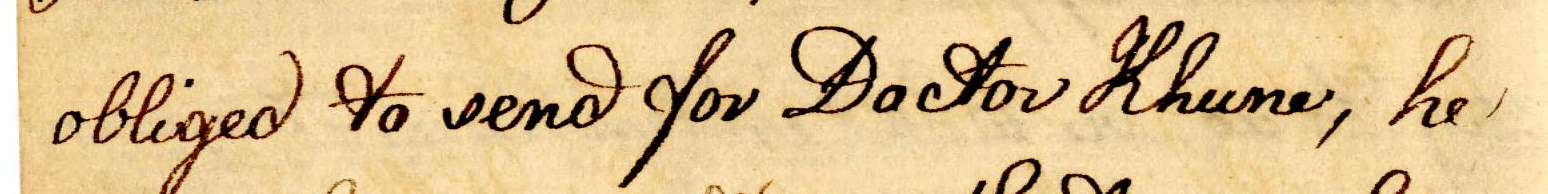obliged to send for Doctor Khune, he
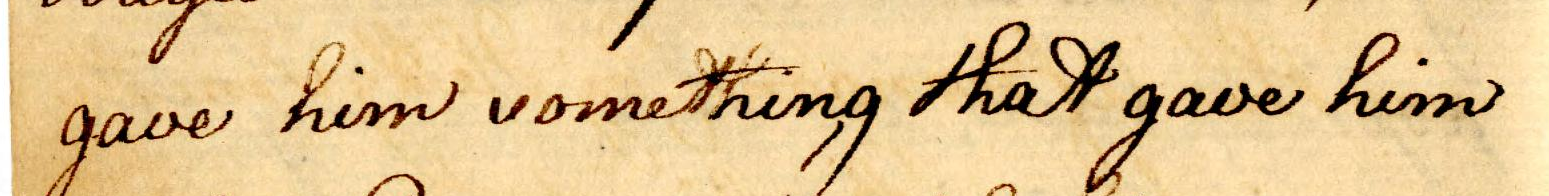gave him something that gave him
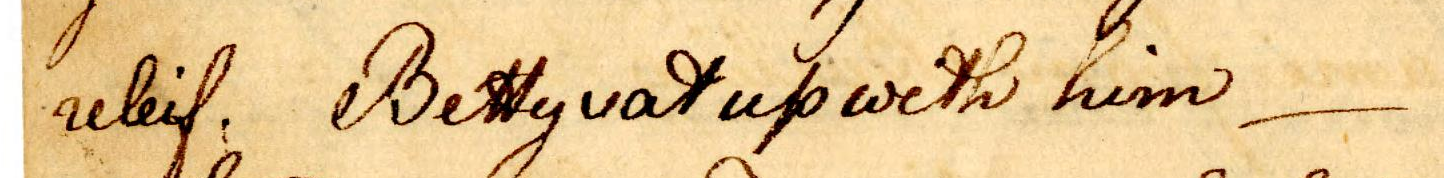releif, Betty sat up with him-
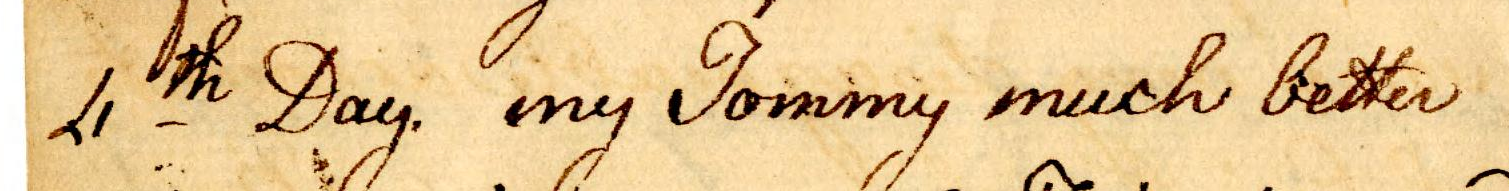4^th Day. my Tommy much better
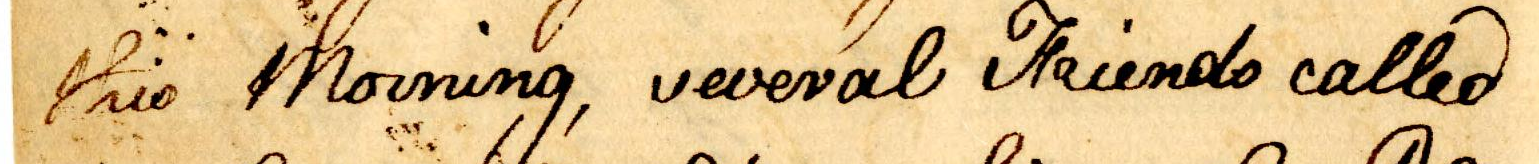this Morning, several Friends called
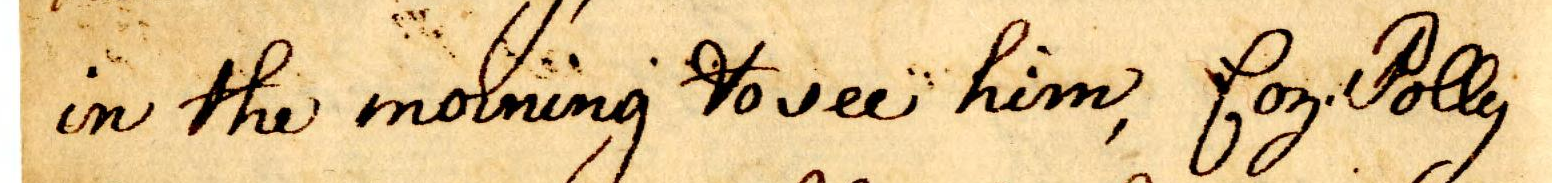in the morning to see him, Coz. Polly
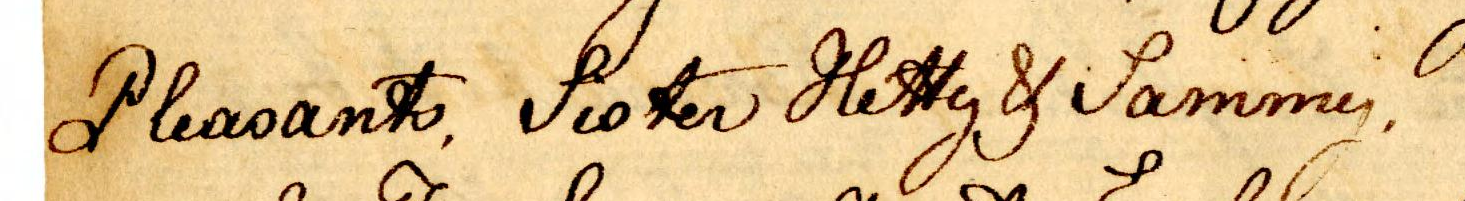Pleasants, Sister Hetty & Sammy,
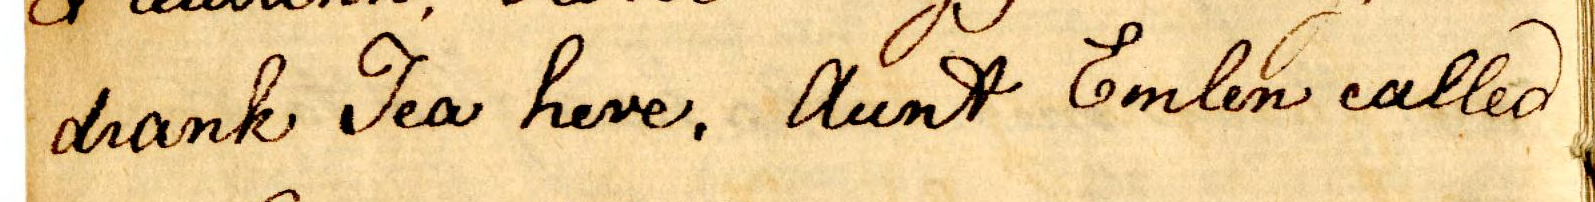drank Tea here, Aunt Emlen called
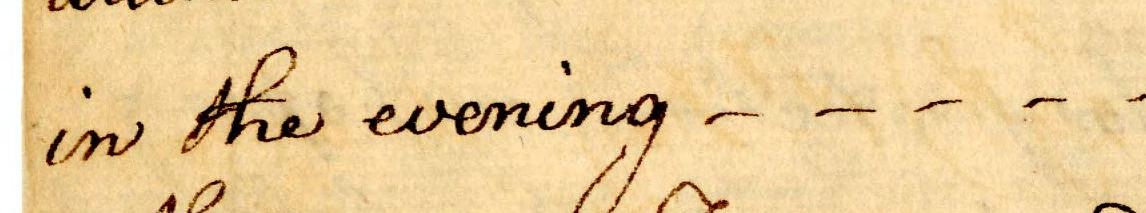in the evening----
